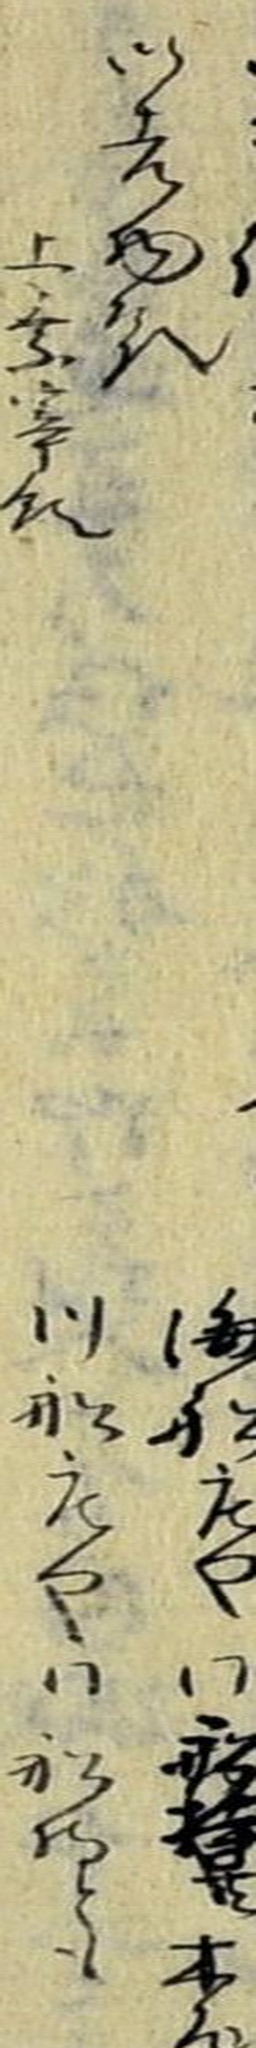上乗宰領川船庄屋同船持とも
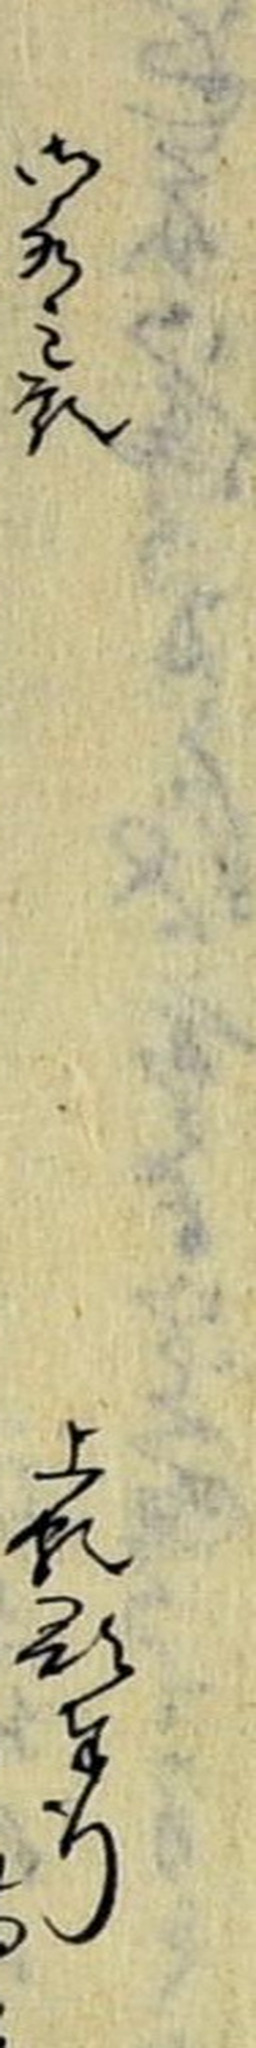御水主頭上領郡奉行
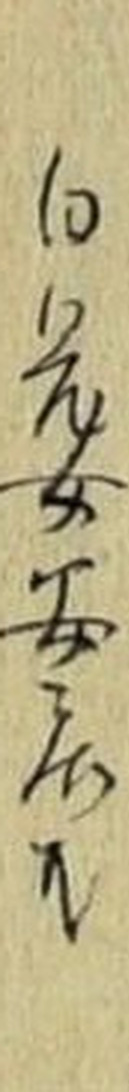白鬼女安居共
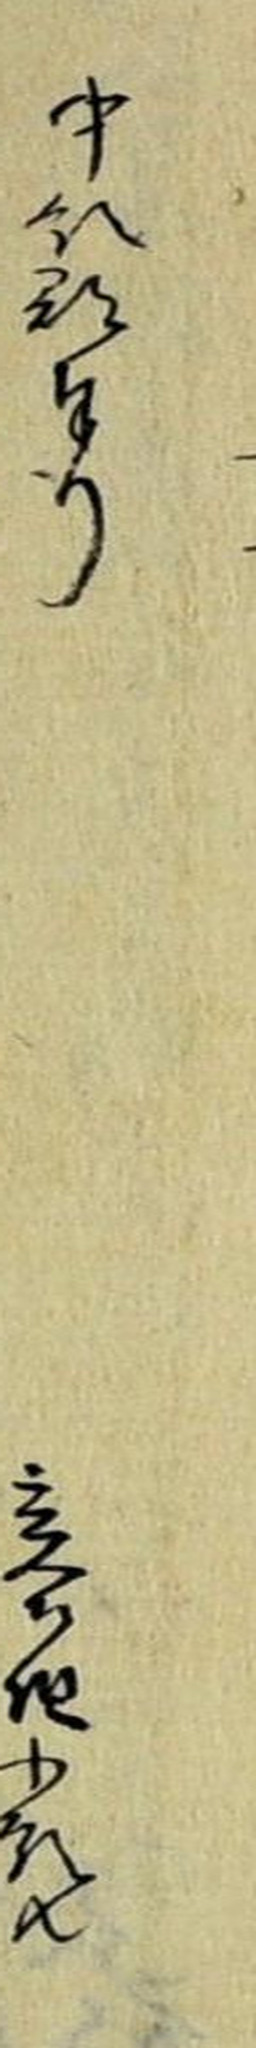中領郡奉行立合他小頭共
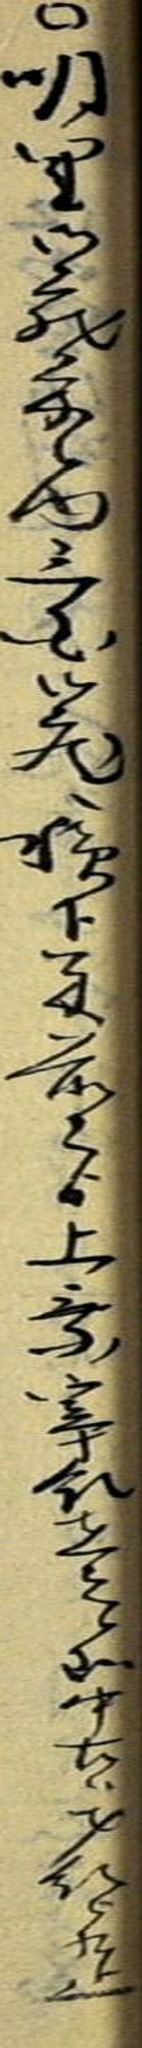○明里御蔵米之内三国御蔵へ積下米前々ゟ上乗宰領在之候処中古は才領被相止
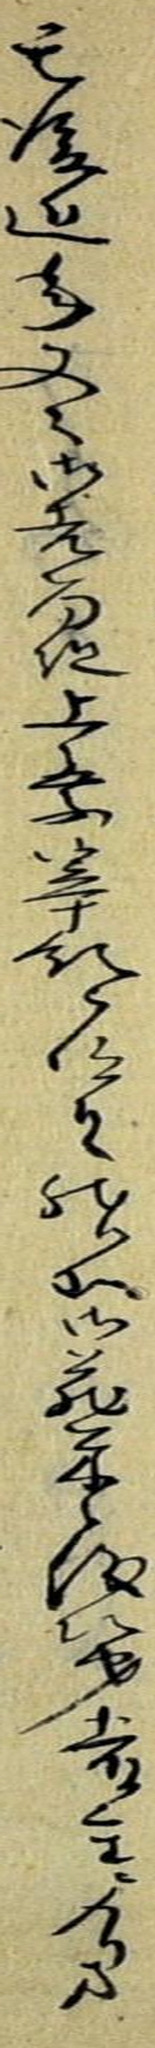其後近年又々御先筒組上乗宰領被仰付候然処御蔵米之儀次第厳重に〆り方
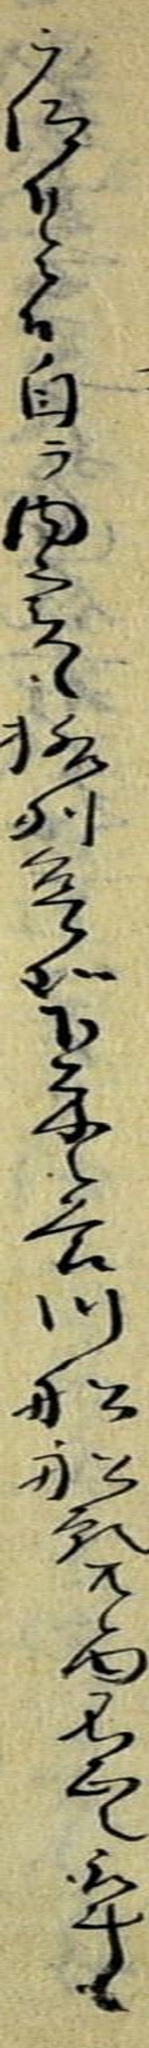被仰付候に付自ら内々にも格別宜候処下米之節川船船頭共之内不正之取斗も
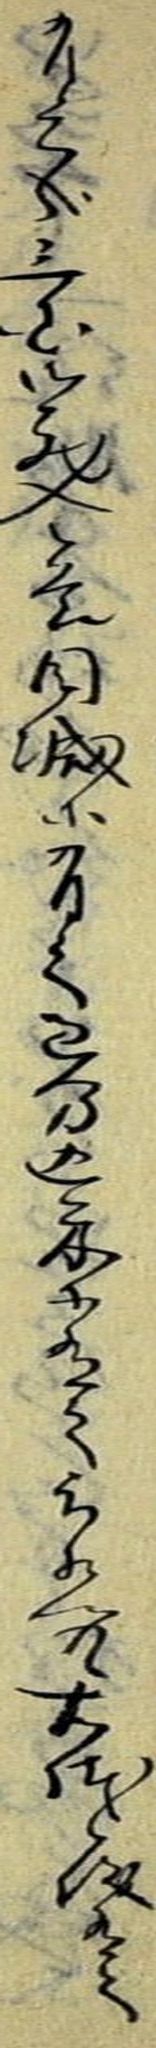有之候哉三国御蔵入之節目減等有之過分込米等有之旨相聞右体之儀有之
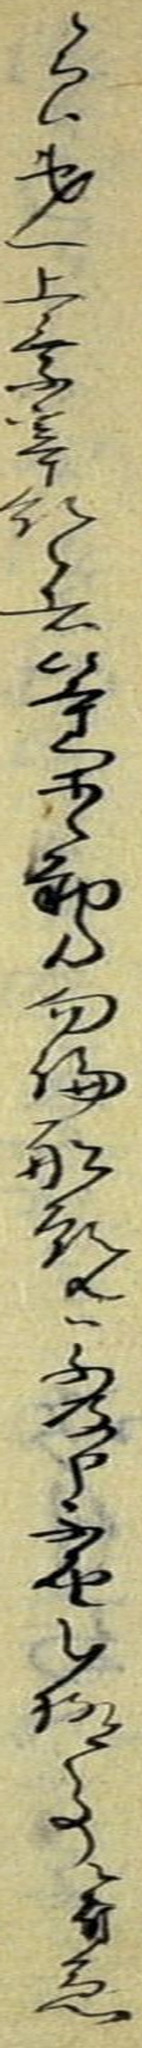候而は第一上乗宰領之者等閑之勤方勿論船頭共は不及申不届至極之事に付急
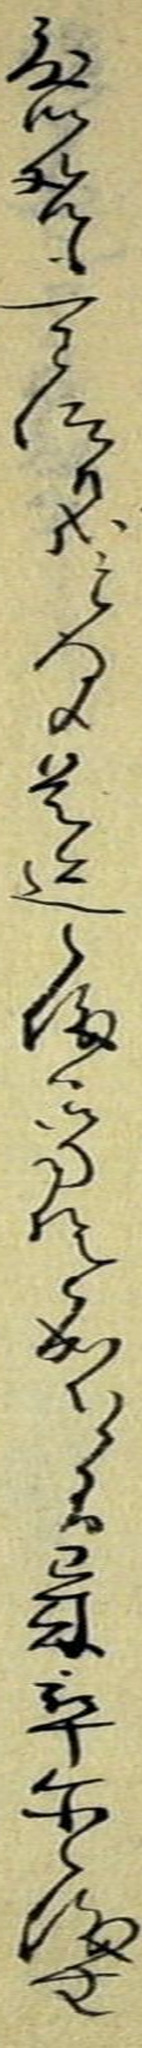度御咎も可被仰付哉に候得共是迄之儀は御用捨に被成下候に付已来卒爾之儀無
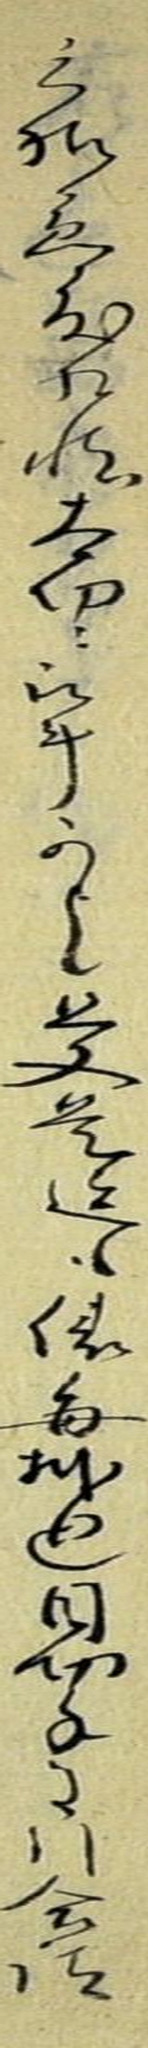之様急度相慎大切に取斗可申候且又是迄も俵毎掛廻目切手に引合請
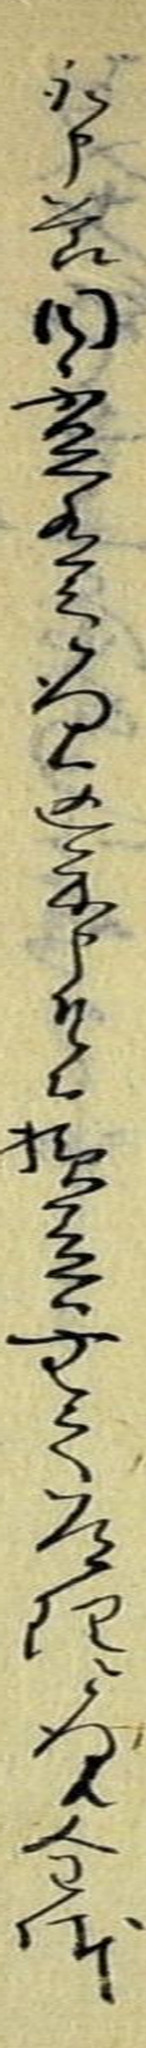取申節目不宜有之候得は込米申付候而損立は無之道理に候得共全体
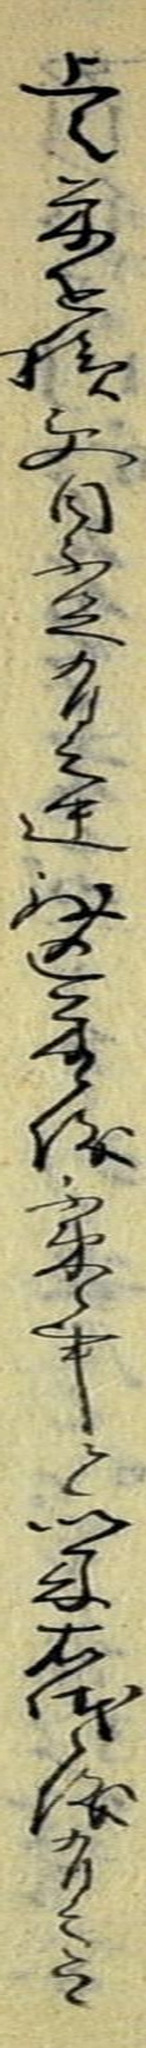上之米を積受目不足有之迚致込米候儀不束之事に候以来右体之儀有之候はヽ
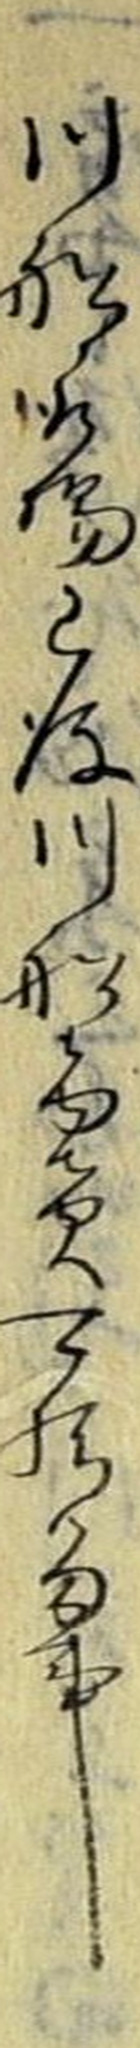川船取揚已後川船商売可指留事
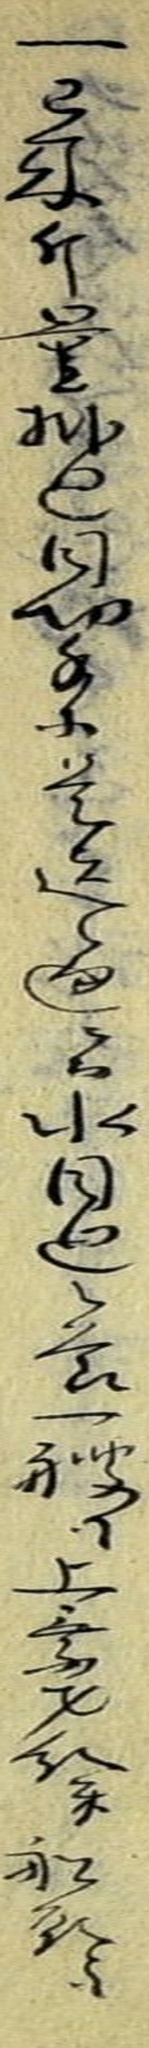一已来斤量掛目目切米等是迄之通に而水目廻之節一艘つヽ上乗才領并船頭とも
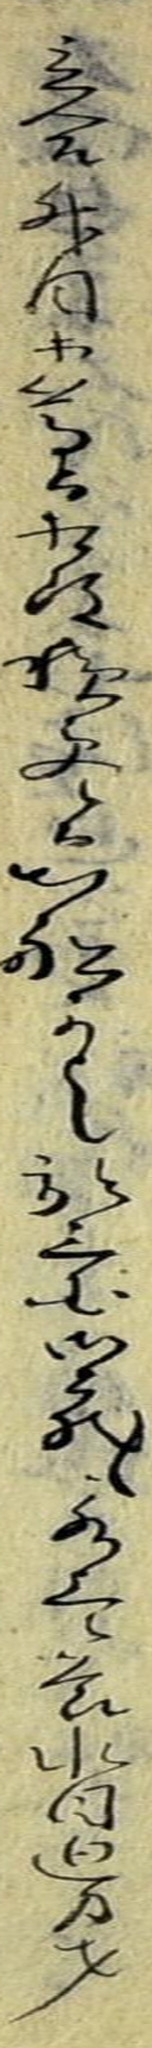立合升目等篤と相改積受候而出船可申候於三国御蔵も水上之節水目廻方才
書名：命令之部 四
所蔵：福井県文書館 Fukui Prefectural Archives
